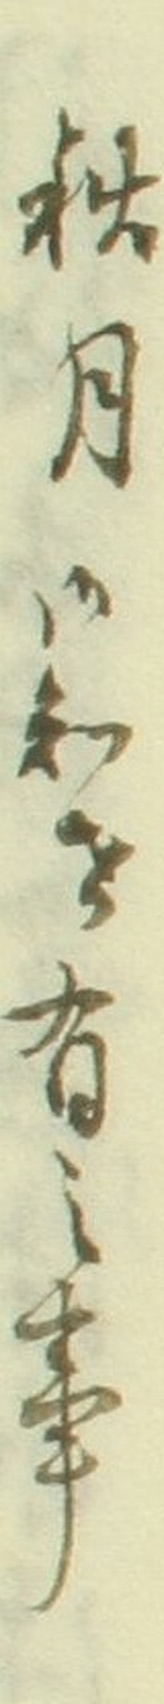秋月御知せ有之事

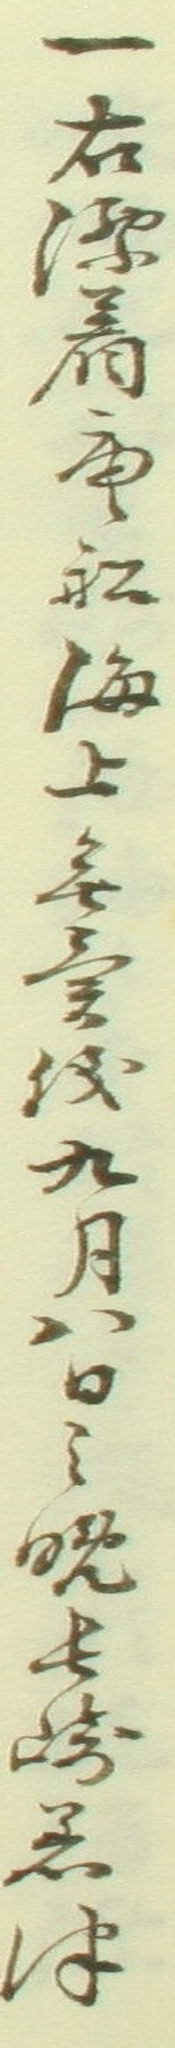一右漂着唐船海上無実儀九月八日之晩長崎着津
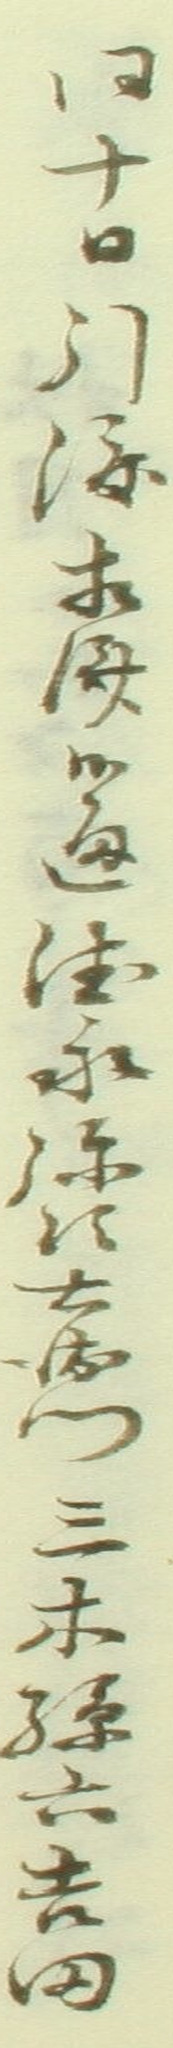同十日引渡相済候通徳永弥次右衛門三木孫六吉田
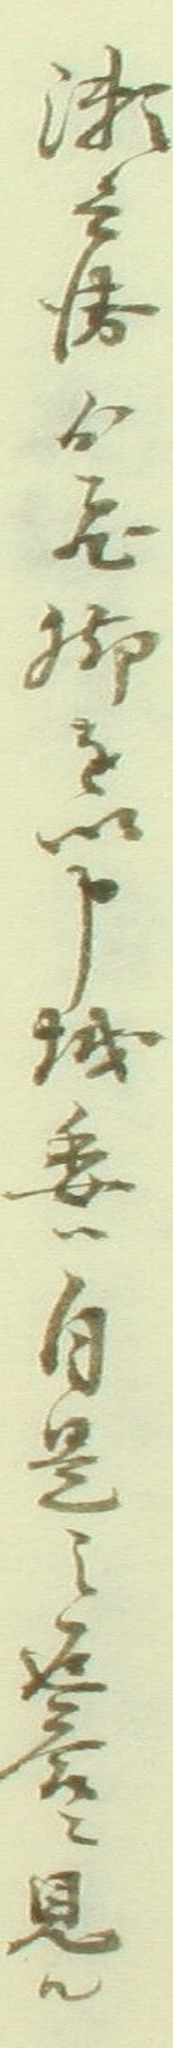瀬兵衛ゟ飛脚を以申越委は自是之返答に見る
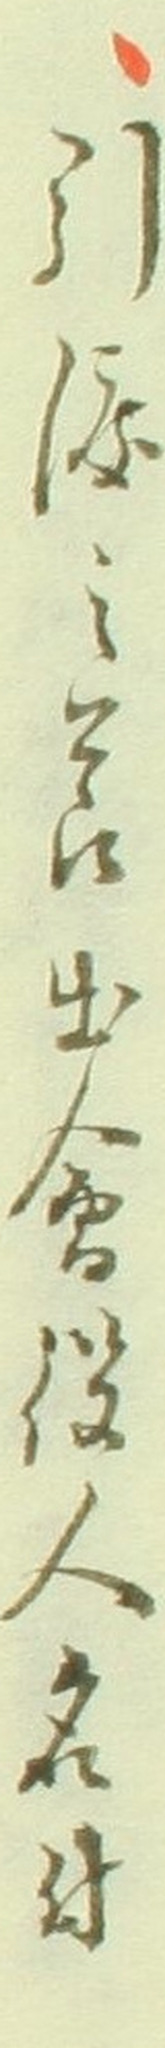引渡之節出会役人名付
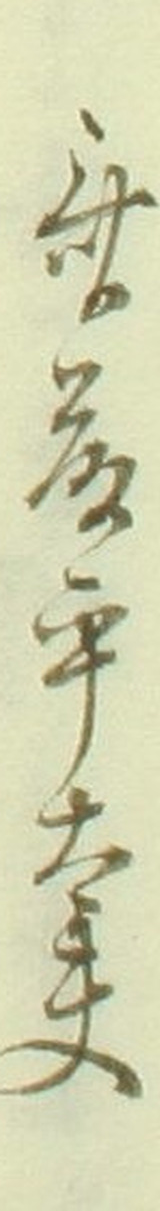斉藤平太夫
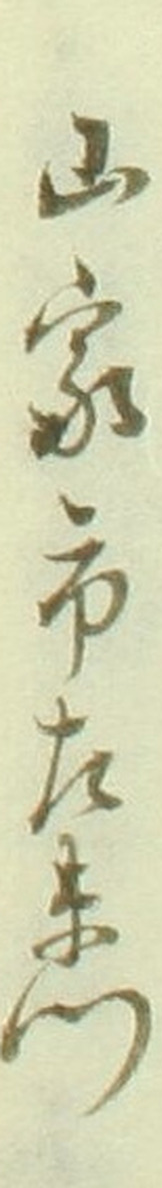山家市左衛門
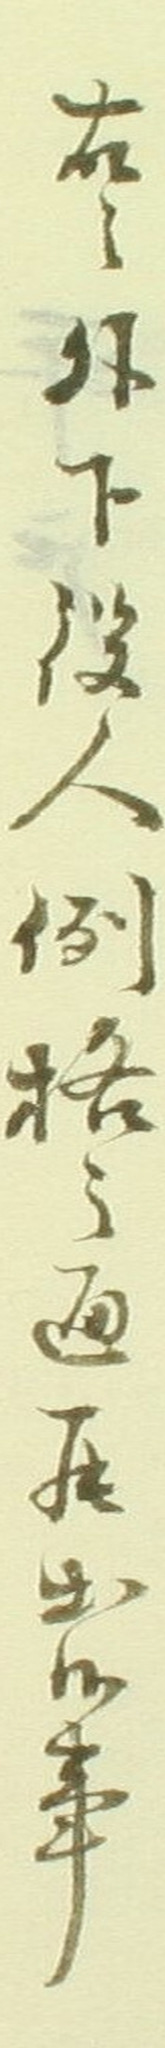右之外下役人例格之通罷出候事
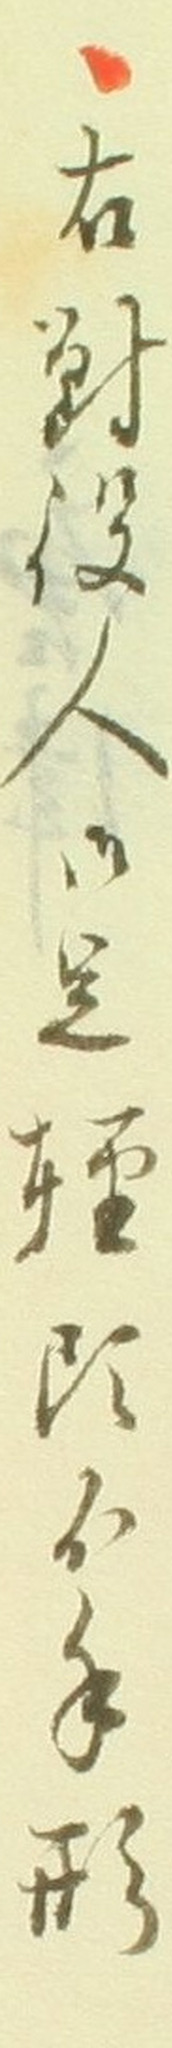右対役人御足軽頭ゟ手形
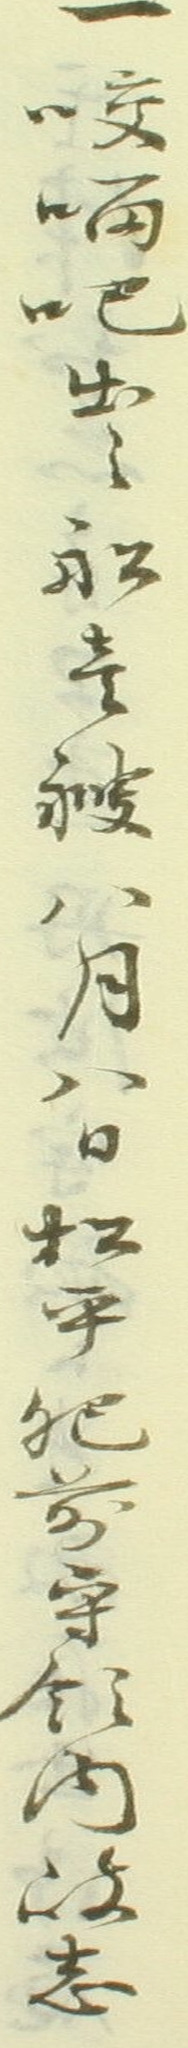一咬𠺕吧出之船壱艘八月八日松平肥前守領内岐志
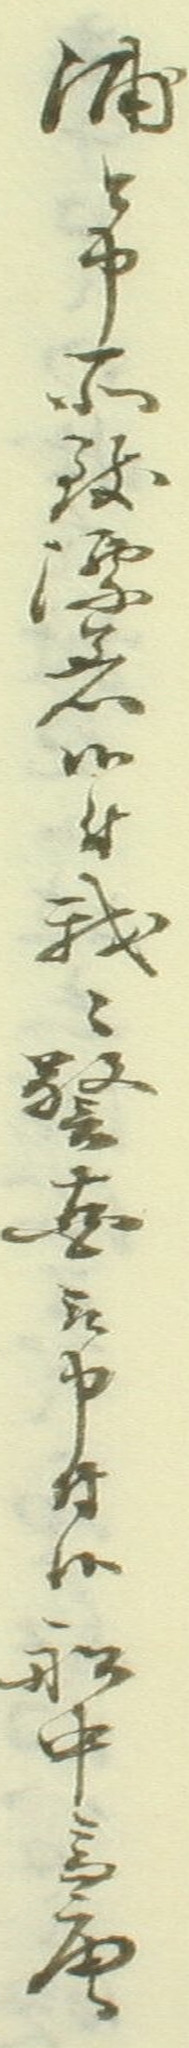浦と申所致漂着候付我々警固被申付候船中に而唐
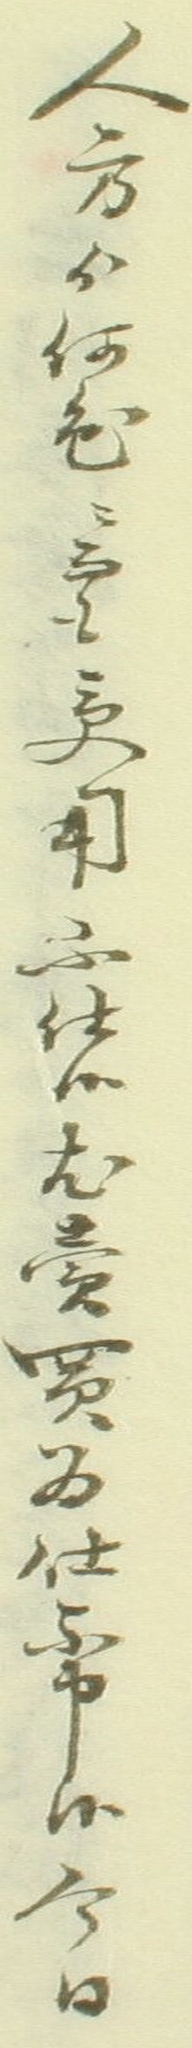人方ゟ何色に而も受用不仕候尤売買為仕不申候今日
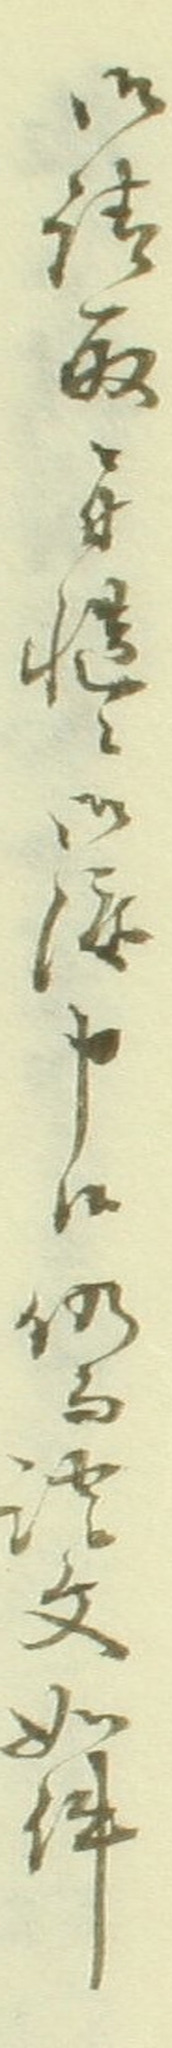御請取に付慥に御渡申候仍而証文如件
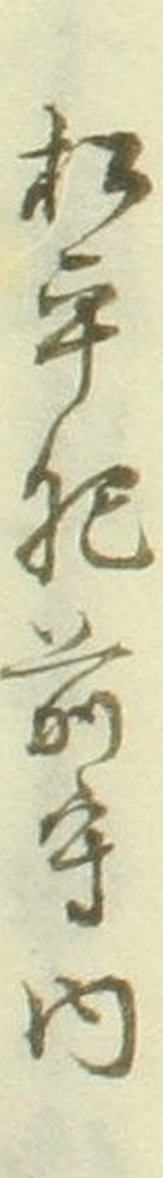松平肥前守内
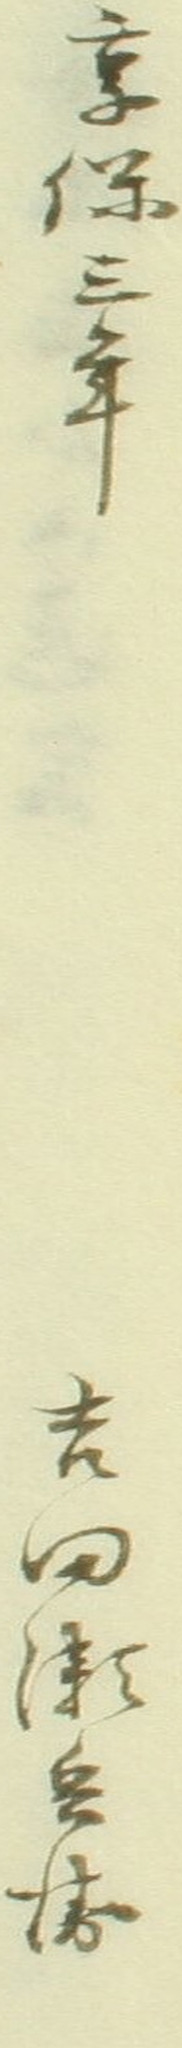享保三年吉田瀬兵衛
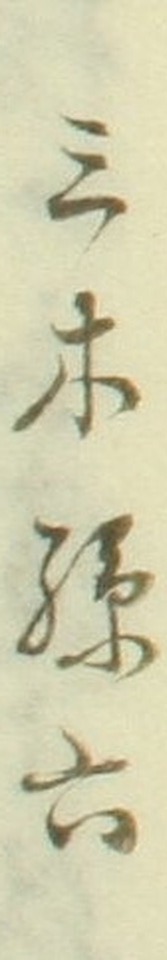三木孫六
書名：異国船漂着記
